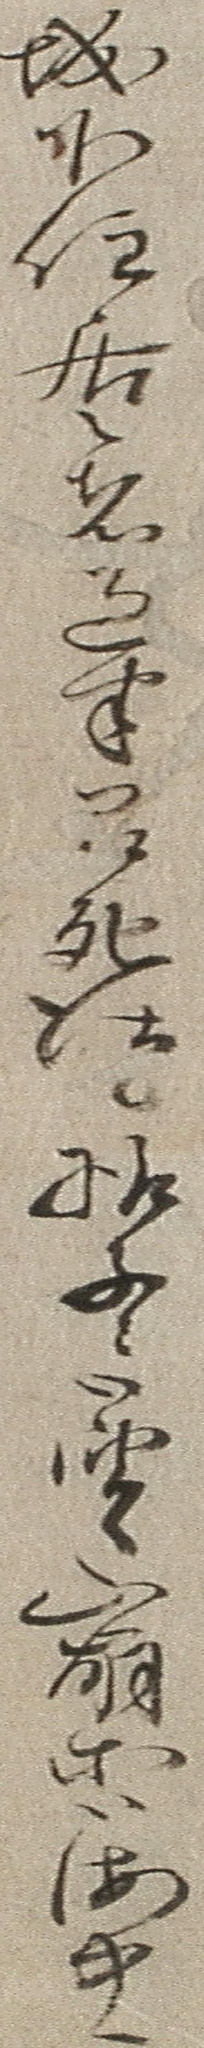城外住居之者過半即死仕候様子に御座候山崩等は海中へ
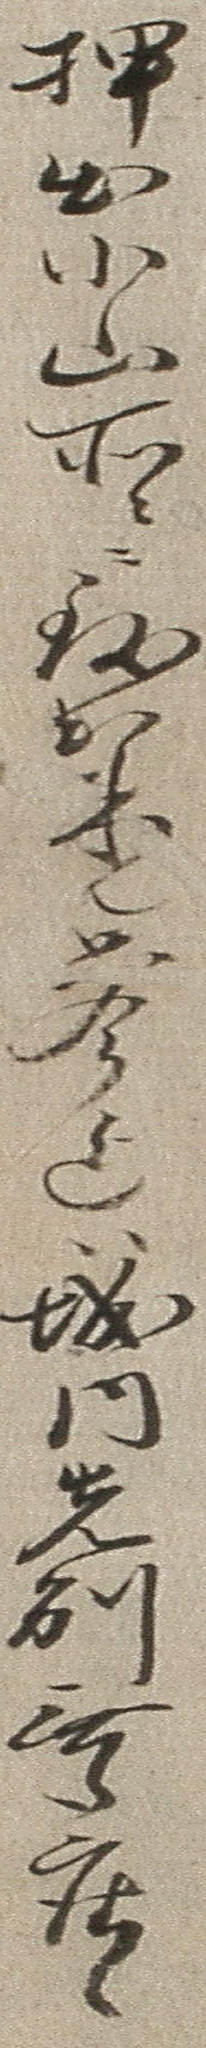押出小山所々に致出来候只今迄は城内先別無御座候
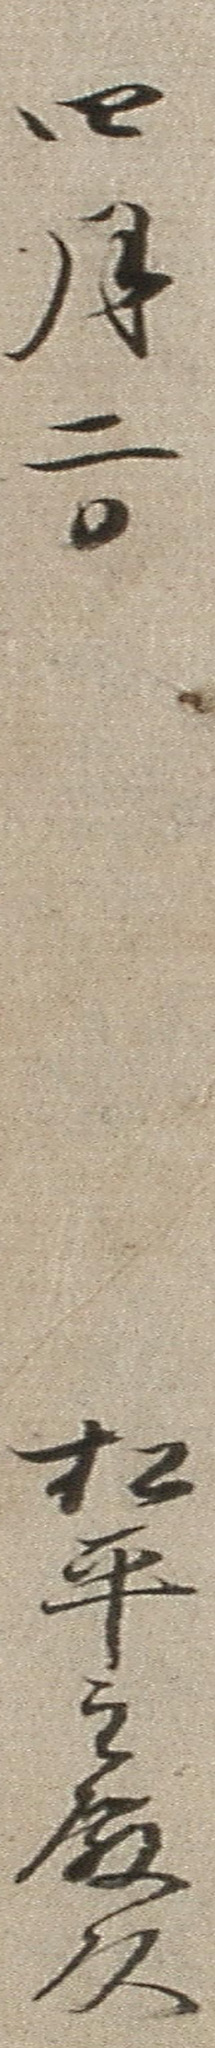四月二日松平主殿頭
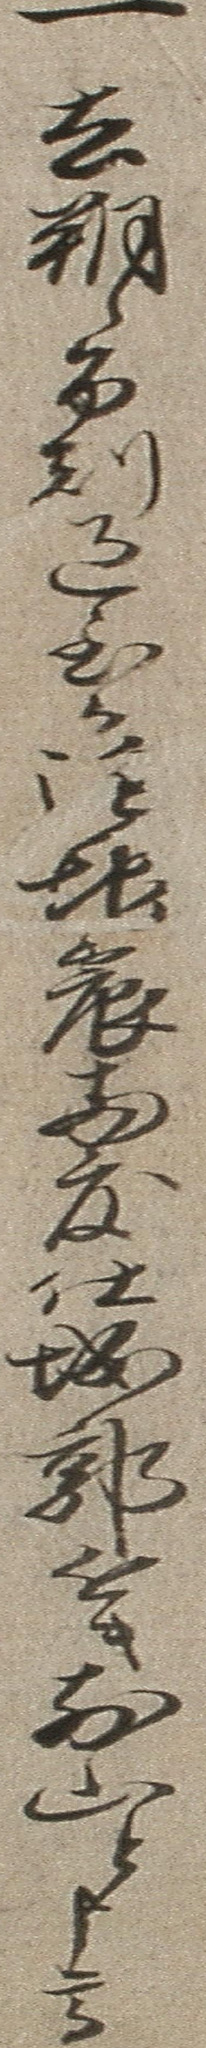一去朔日酉刻過至而強地震両度仕城郭近き前山と申高
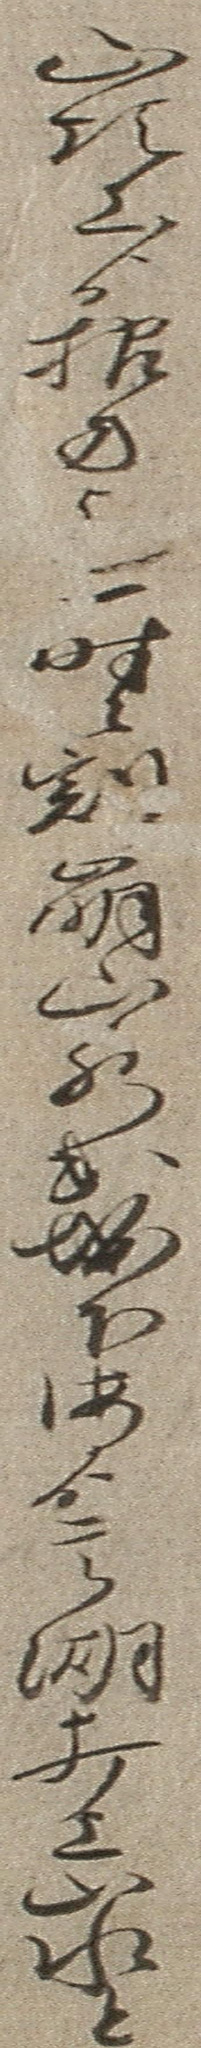山頂上ゟ根方迄一時に割崩山水出城下海ゟ高潮打上山水と
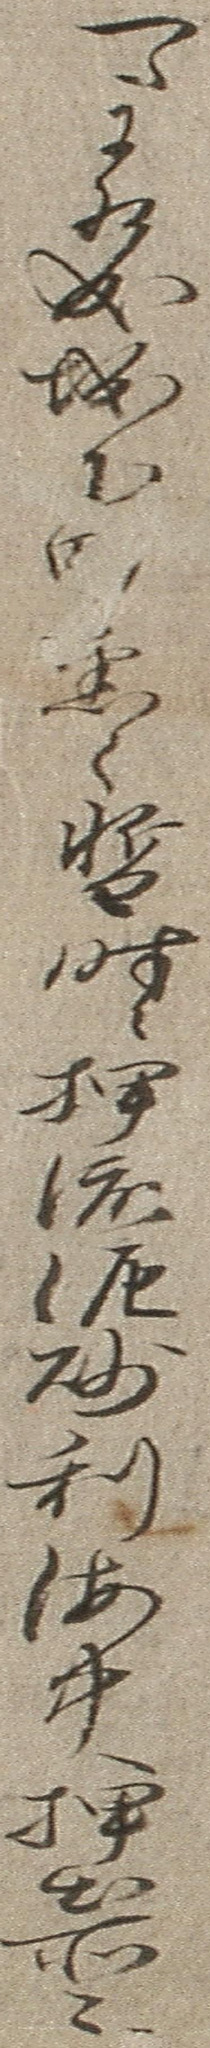一ッに相成城下町家悉く暫時に押流泥砂利海中へ押出所々
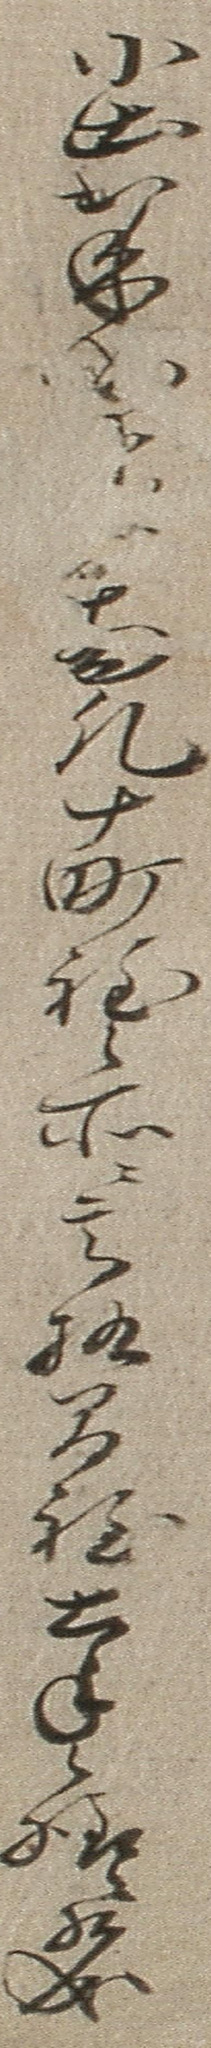小山出来城下町ゟ南凡十町程之所に高拾間程土手之様に相成
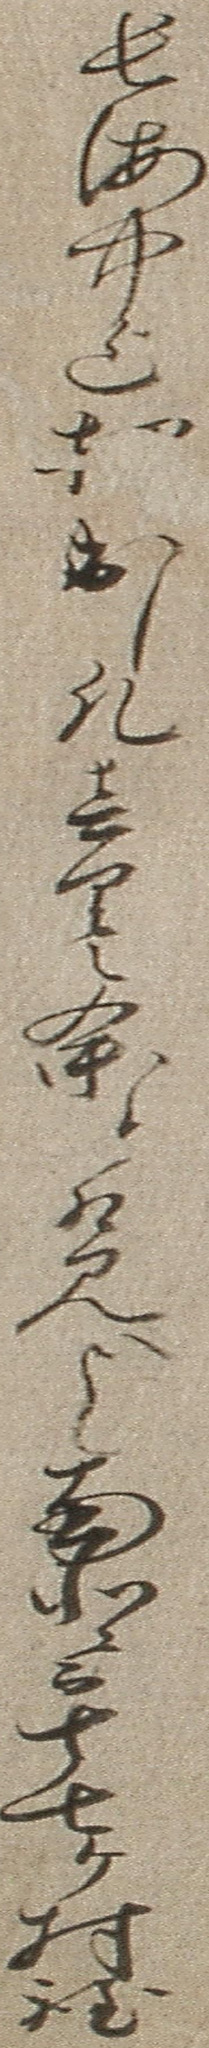長海中迄押出候凡壱里余と相見へ申候南北に而十七ヶ村程
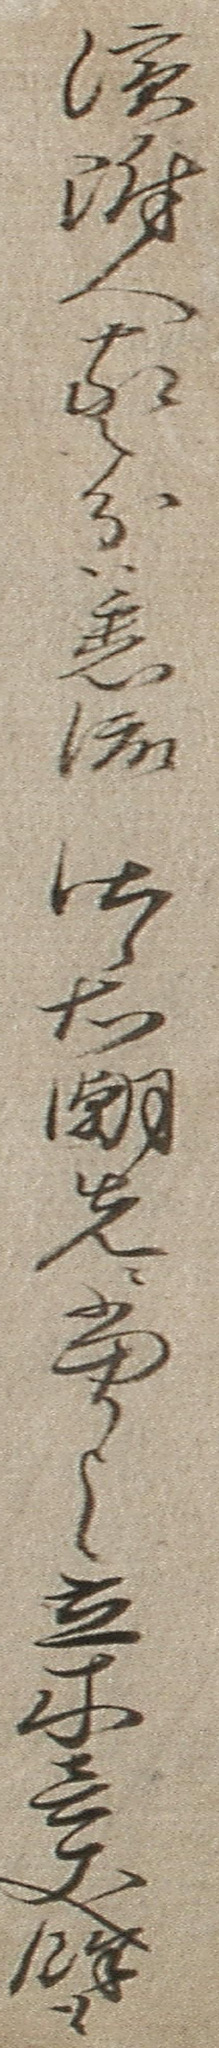浜附人家之分は悉流仕候右潮先に当り申候立木壱丈余も
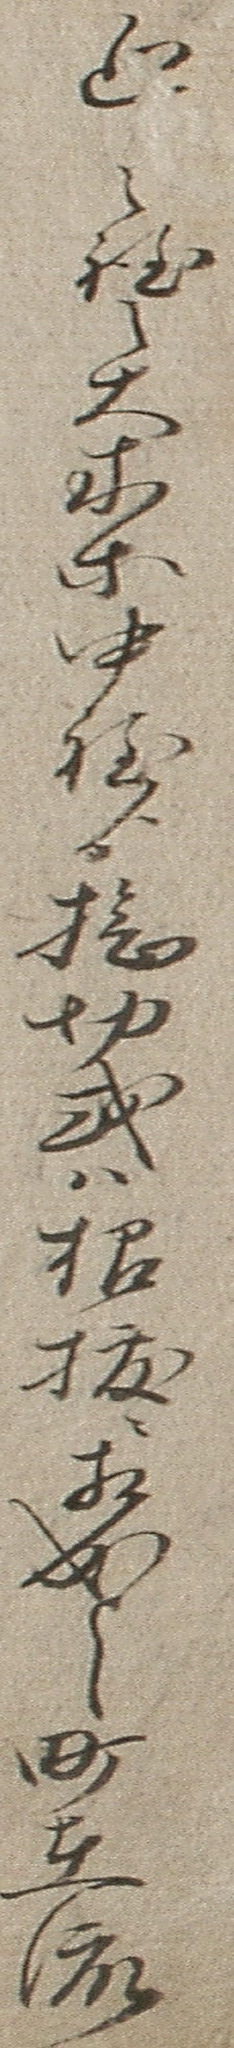廻候程之大木等中程ゟ捻切或は根抜に相成申候町在流
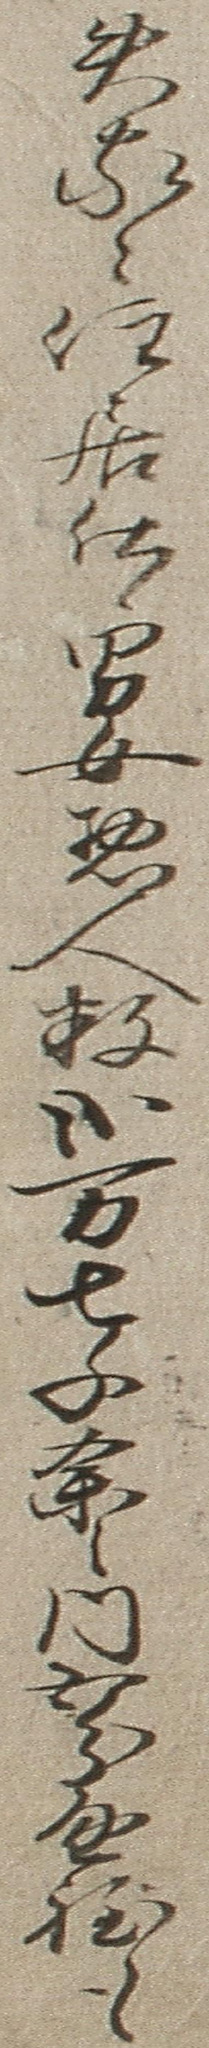失家々住居仕候男女惣人数弐万七千余之内五分通程も

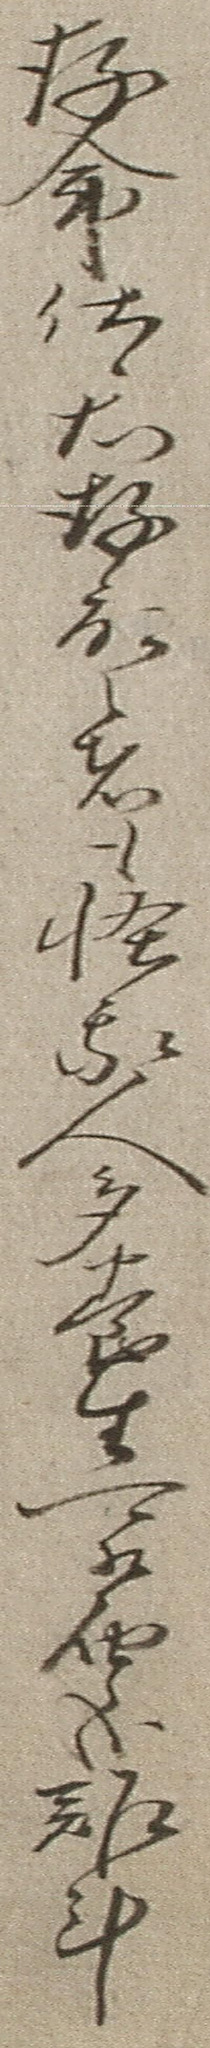存命仕候右存命候者も怪我人多養生可相届候哉難斗
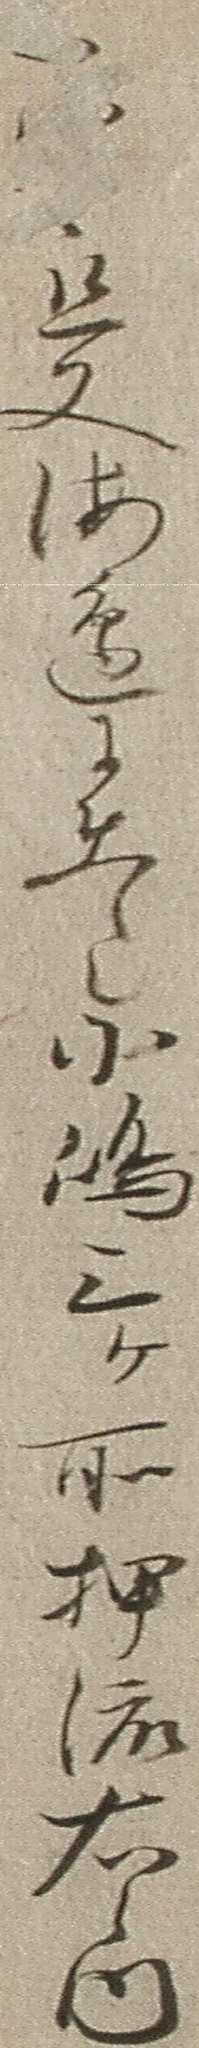御座候且又海辺に在之候小嶋三ヶ所押流右之内
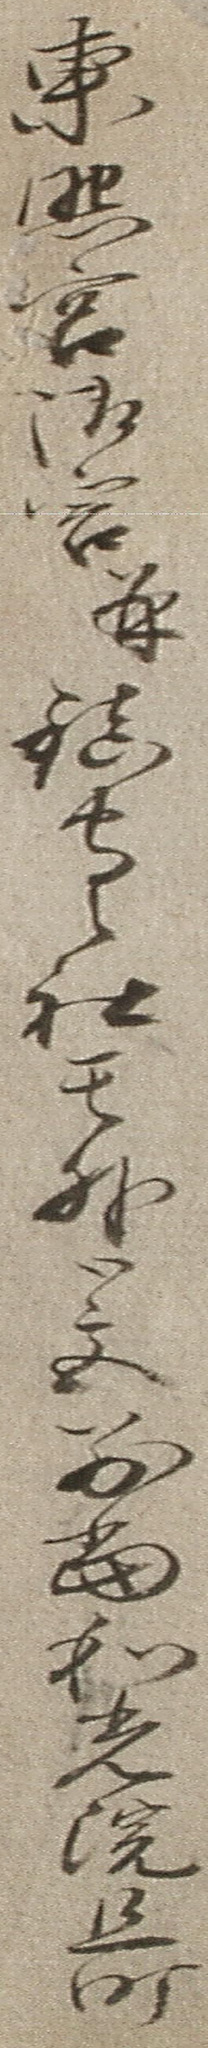東照宮御宮并鎮守之社其外御宮別当和光院且町
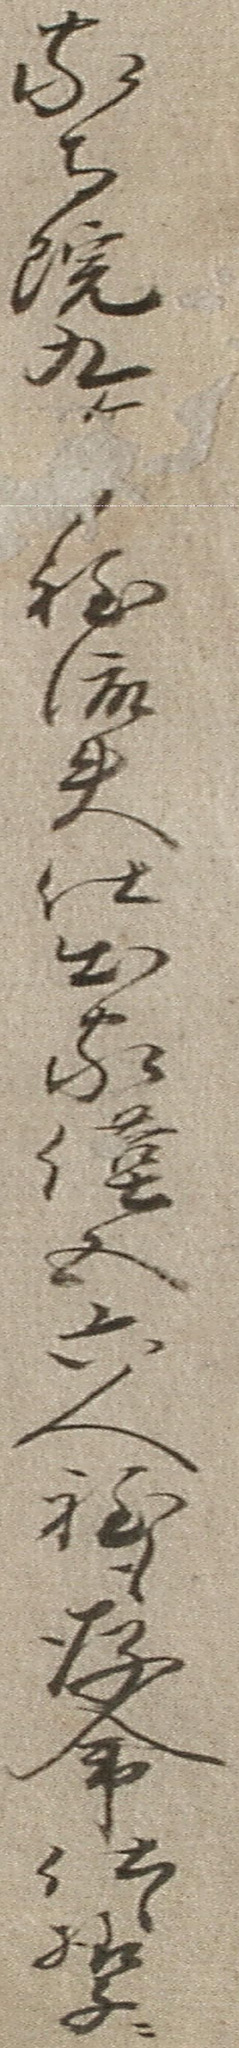家寺院九ヶ寺程流失仕出家僅五六人程も存命仕候様子に
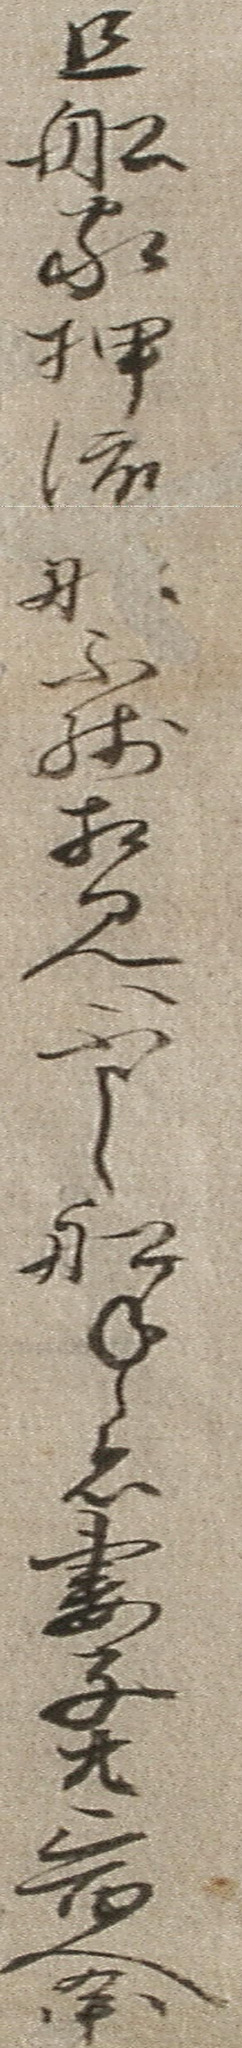且船家押流船不残相見へ不申候船手之者妻子共三百人余
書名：太平秘録抜書　浅間山燒及普賢山崩
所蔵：東京大学地震研究所図書室 Earthquake Research Institute Library, The University of Tokyo, JAPAN
